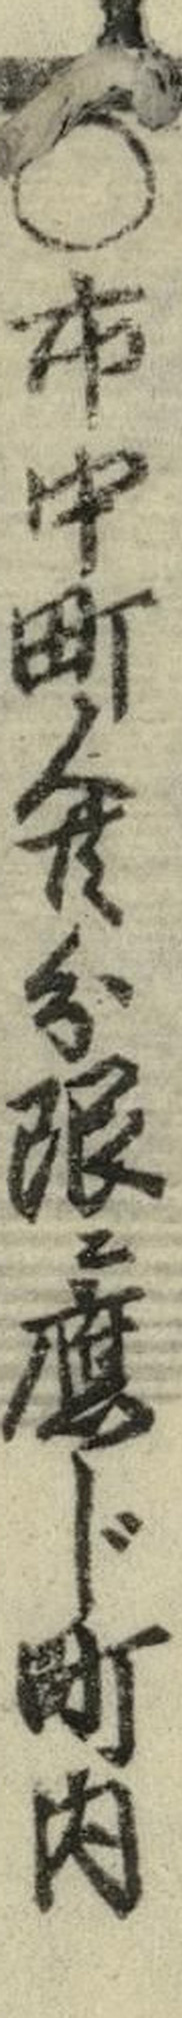〇市中町人共分限ニ応じ町内
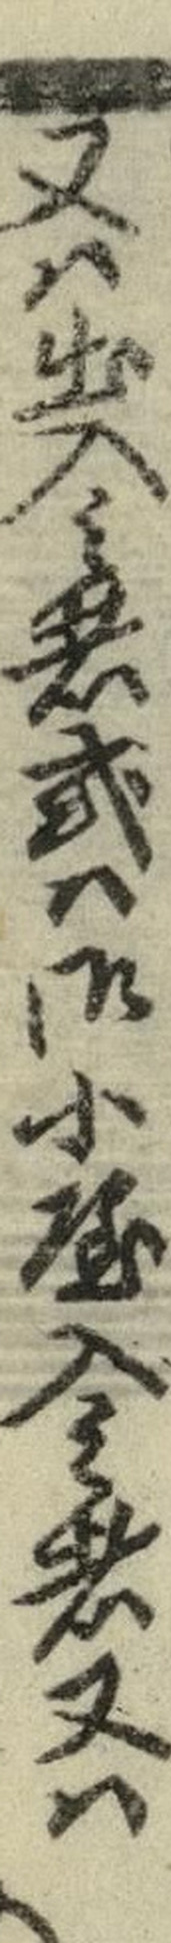又は出入之者或は御小屋入之者又は
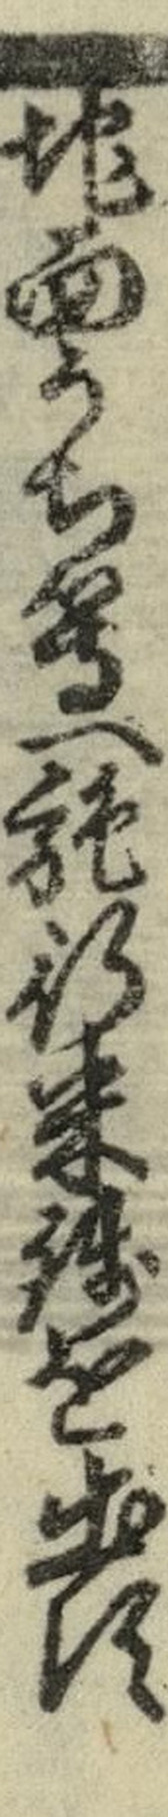地面うち等へ施行米銭を出す

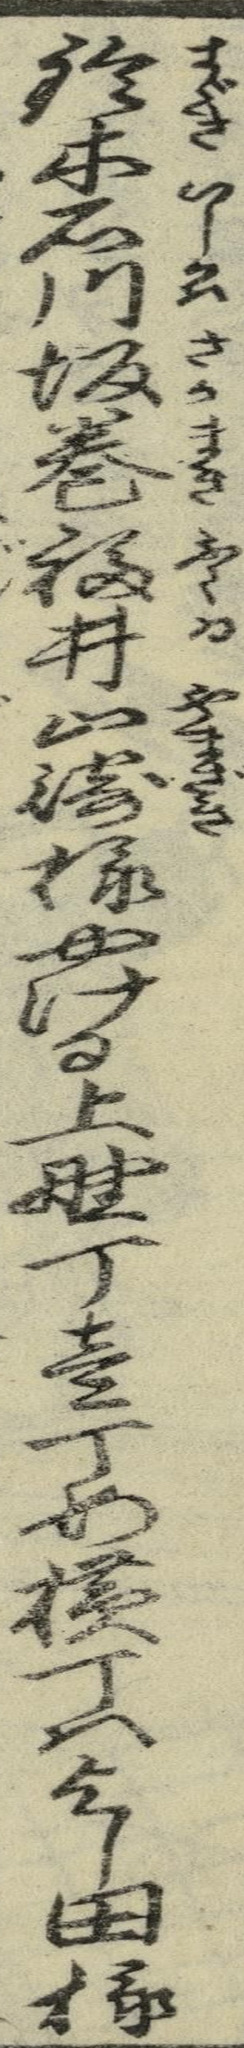鈴木石川坂巻福井山崎様やける上野丁壱丁め横丁はよし田様
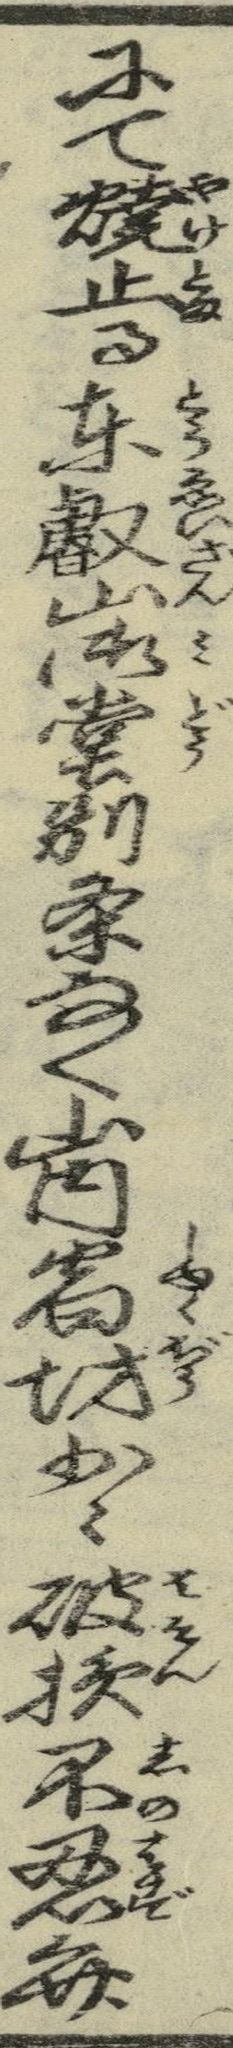にて焼止る東叡山御堂別条なく山内宿坊少々破損不忍弁
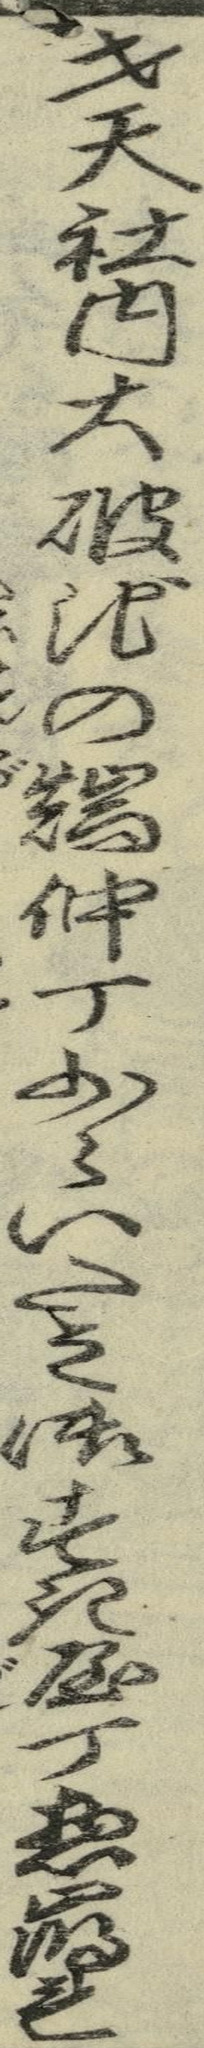才天社内大破池の端仲丁少々いたみ御すき屋丁惣崩れ
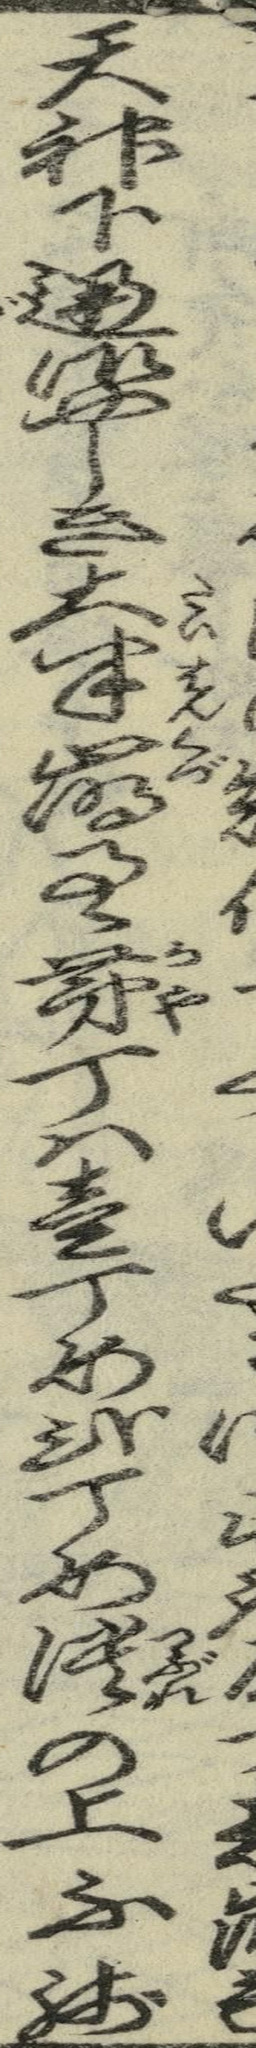天神下通御やしき大半崩るゝ茅丁は壱丁め弐丁め潰の上不残
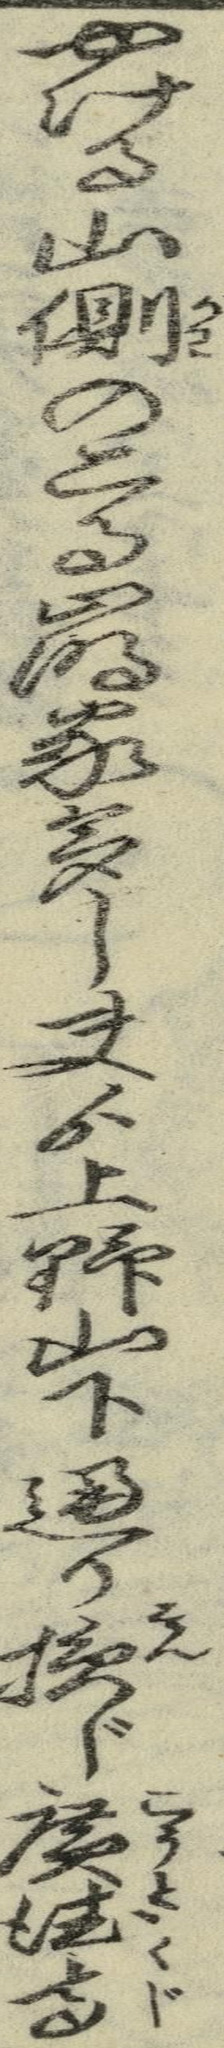やける山側のこる崩家多し夫ゟ上野山下通り損じ広徳寺
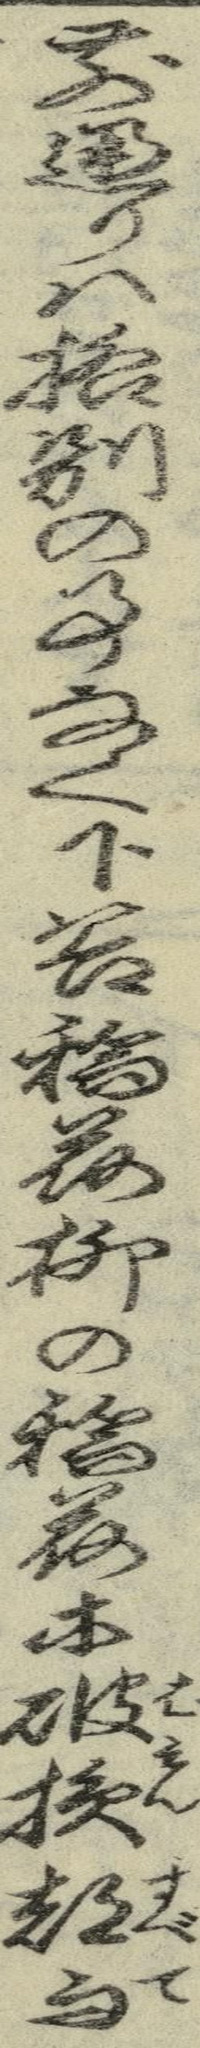前通りは格別の事なく下谷稲荷柳の稲荷等破損都而
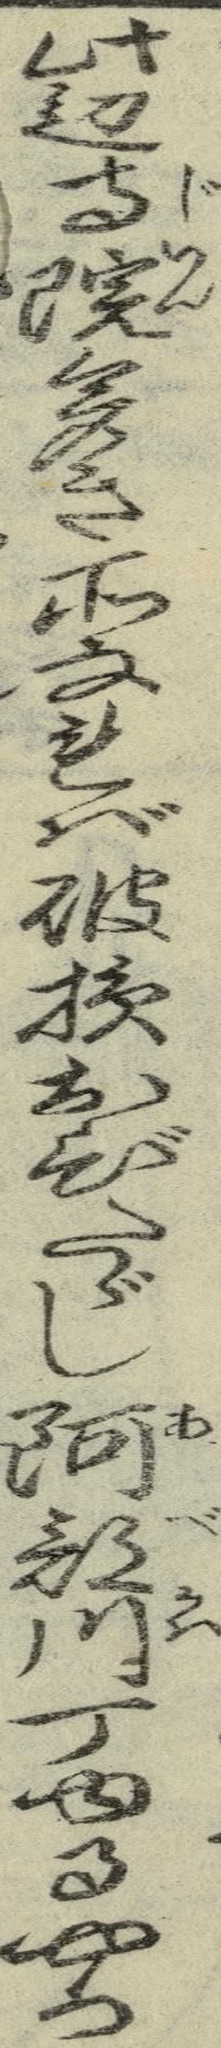此辺寺院多き所なれば破損おびたゞし阿部川丁ゆるやか
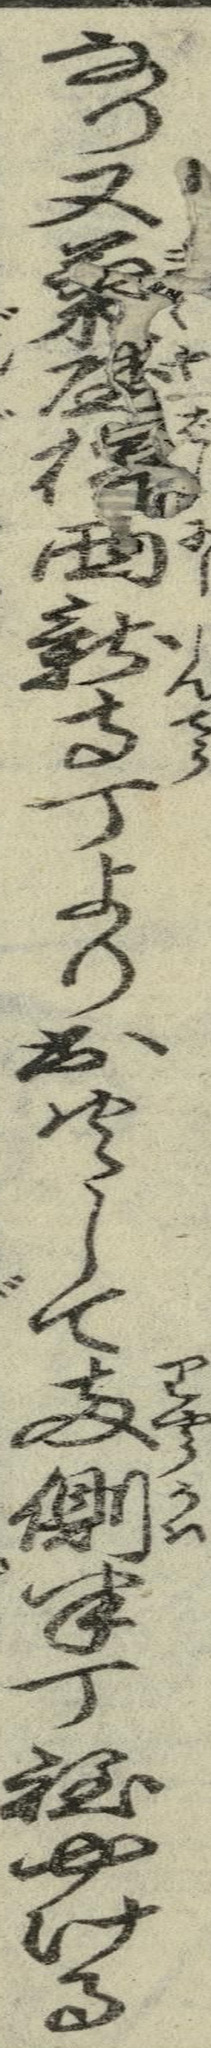なり又菊屋橋西新寺丁より出火して両側半丁程やける
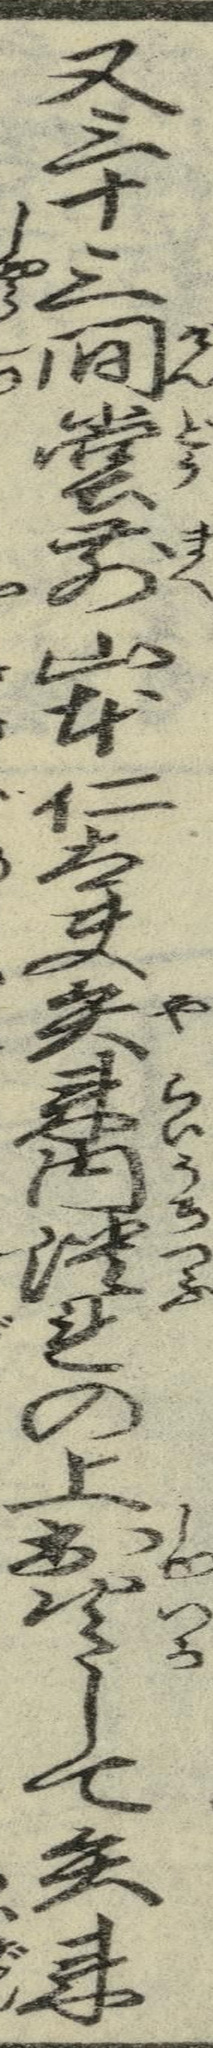又三十三間堂前山本仁太夫矢来内潰れの上出火して矢来
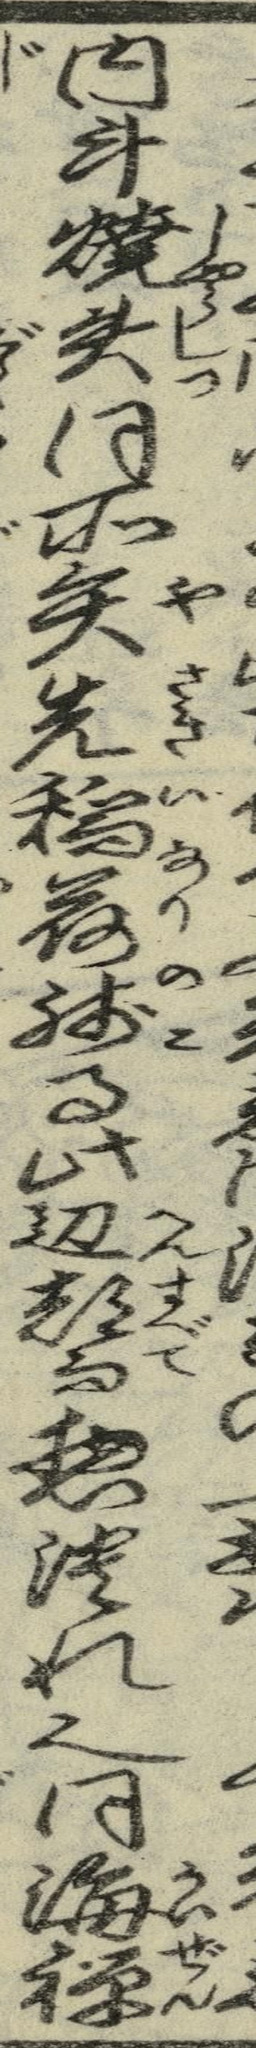内斗焼失同所矢先稲荷残る此辺都而惣潰れ也同海禅
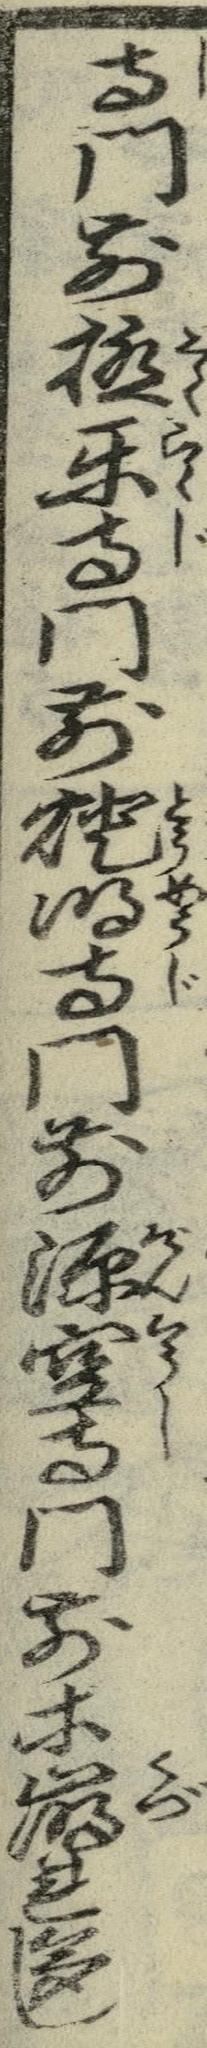寺門前極楽寺門前燈明寺門前源空寺門前等崩れ多し
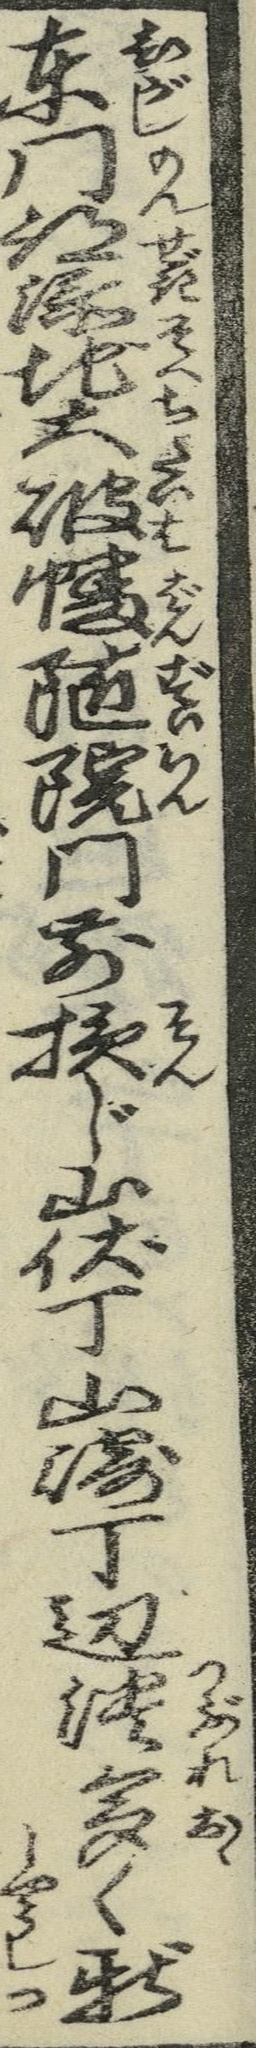東門跡添地大破幡随院門前損じ山伏丁山崎丁辺潰多く新
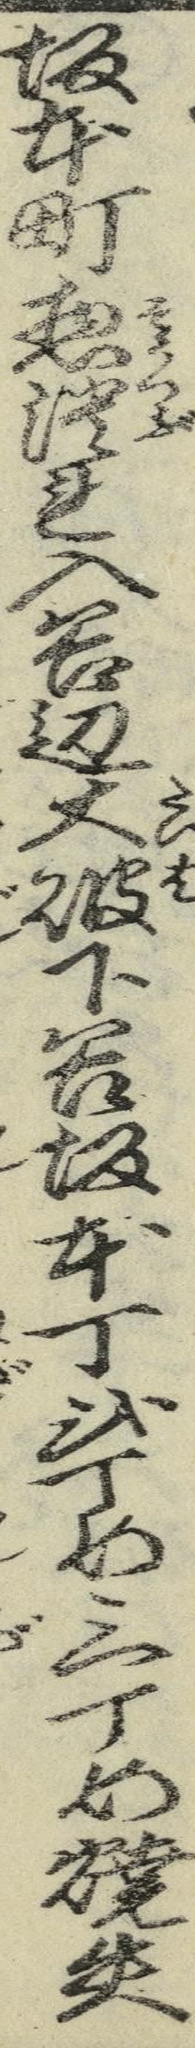坂本町惣潰れ入谷辺大破下谷坂本丁弐丁め三丁め焼失
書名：地震年代記
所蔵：東京大学地震研究所図書室 Earthquake Research Institute Library, The University of Tokyo, JAPAN
